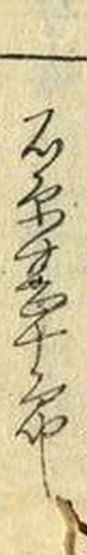石原甚十郎
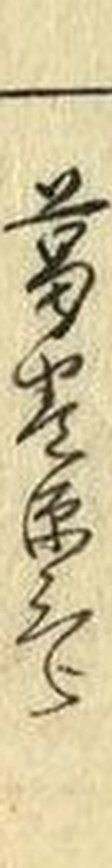葛巻源三郎
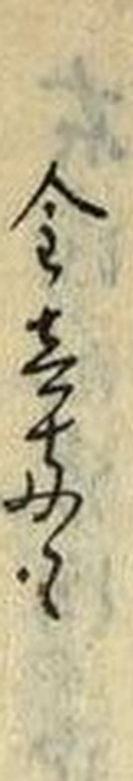金壱両ツヽ
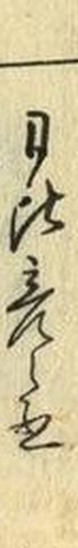日比彦之丞
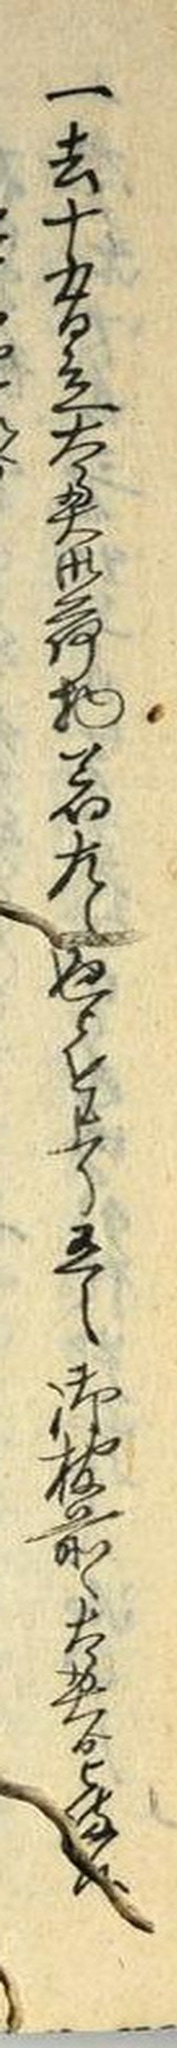一去十五日立大奥御荷物着左之通被進上リ有之御棺前へ大奥ゟ被備候
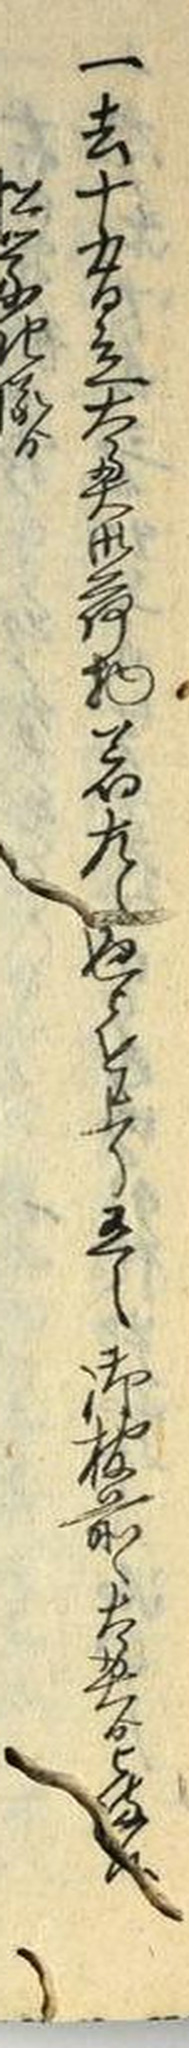一去十五日立大奥御荷物着左之通被進上リ有之御棺前へ大奥ゟ被備候
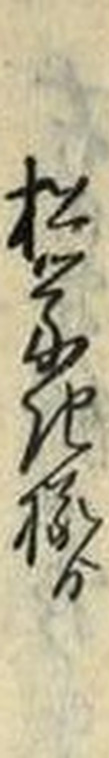松栄院様ゟ
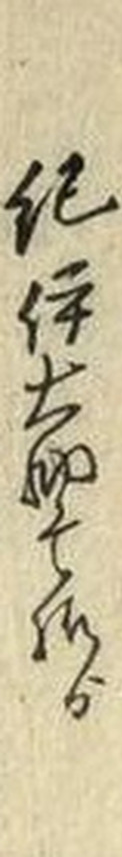紀伊大納言様ゟ
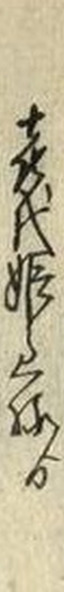喜代姫君様ゟ
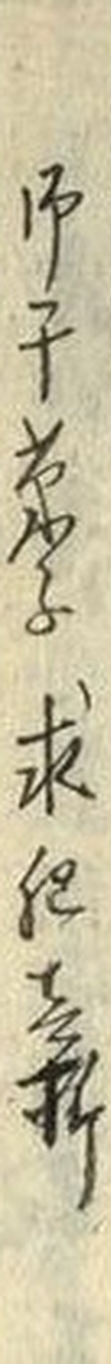御干菓子求肥壱折
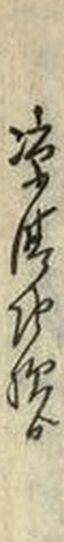涼晴院様ゟ
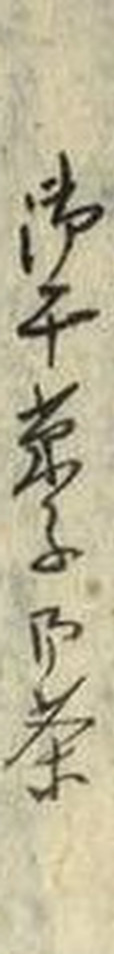御干菓子壱折

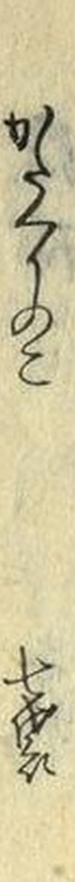かたくりのこ七袋
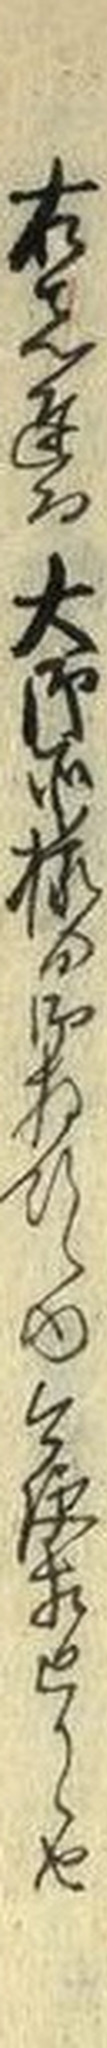右先達而大御所様ゟ御拝領之内今便相廻り候由
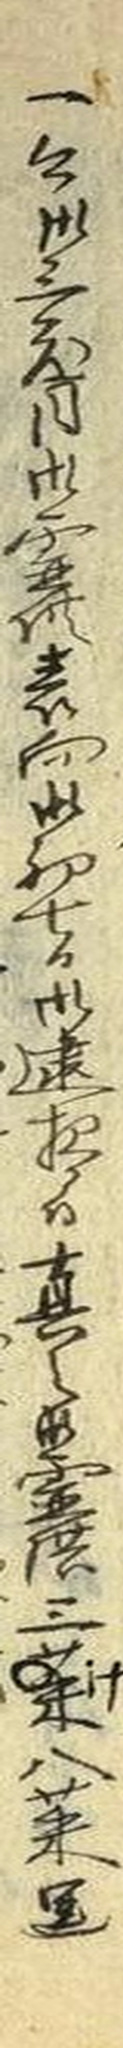一今御三度目御霊供表向御初七日御逮夜ニ付真之御霊供三汁八菜運
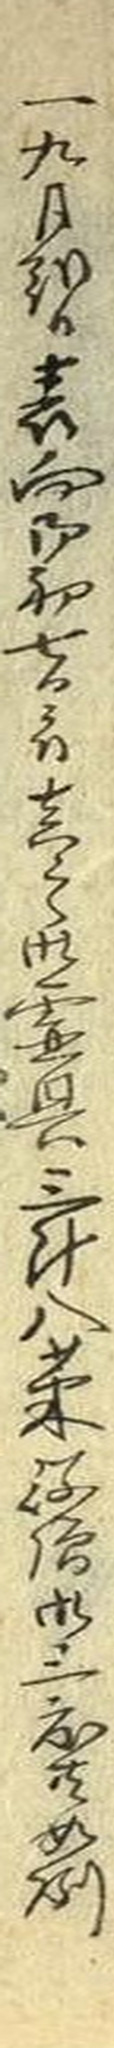一九月朔日表向御初七日ニ付真之御霊具三汁八菜役僧御三度共如例
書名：少傅日録抄（斉善付側向頭取日記、江戸并道中、初入在国、逝去後…
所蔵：福井県文書館 Fukui Prefectural Archives
